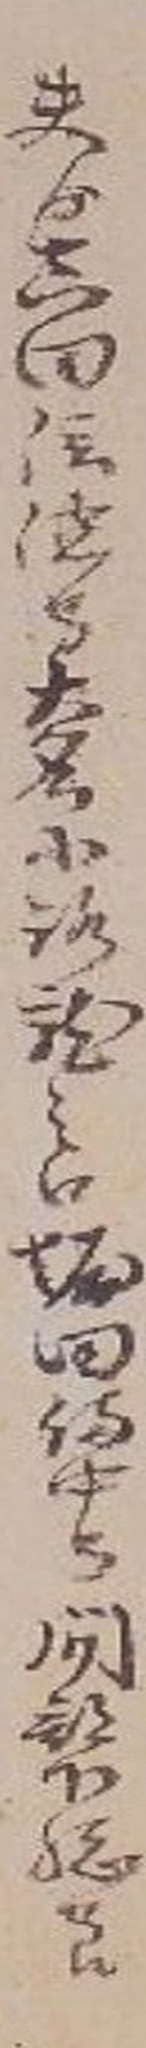夫ゟ真田信濃守大名小路龍之口堀田備中守間部下総守え
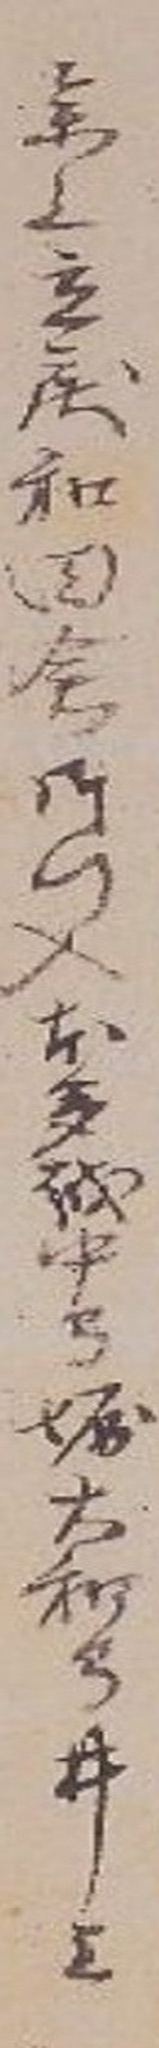参上立戻和田倉御門入本多越中守堀大和守井上
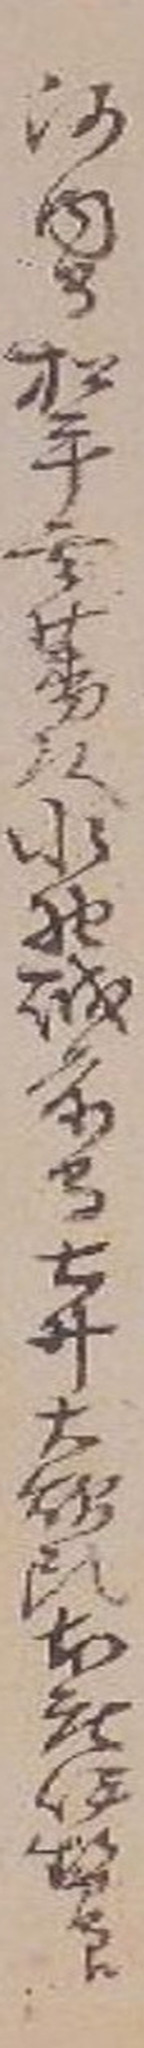河内守松平玄蕃頭水野越前守土井大炊頭本庄伊勢守え
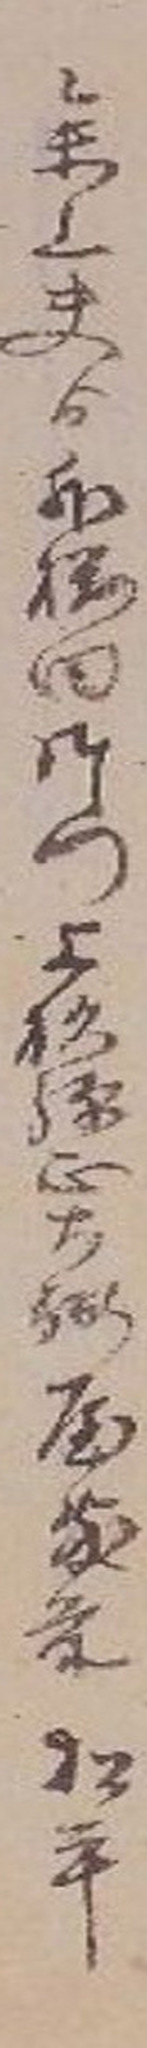参上夫ゟ外桜田御門上杉弾正大弼屋敷前松平
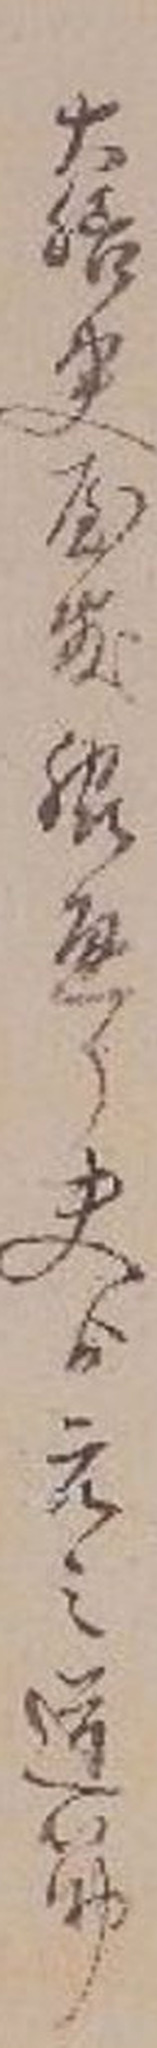大膳大夫屋敷脇通り夫ゟ元之道筋

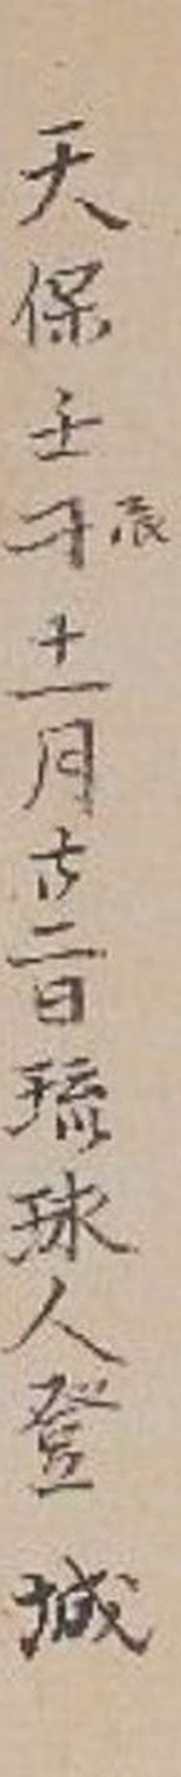天保壬寅十一月廿日琉球人登城
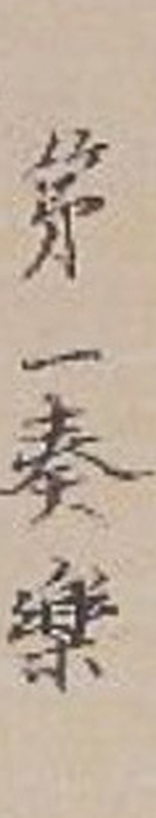第一奏楽
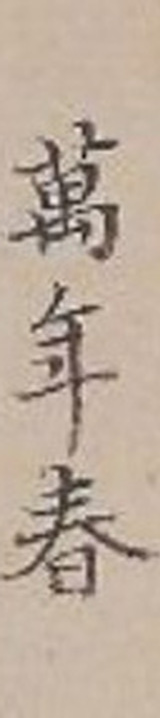万年春

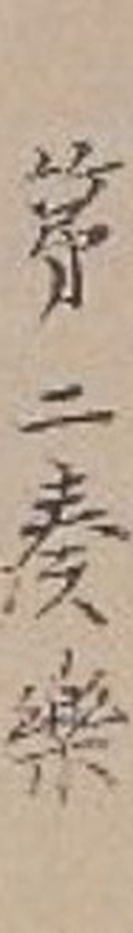第二奏楽
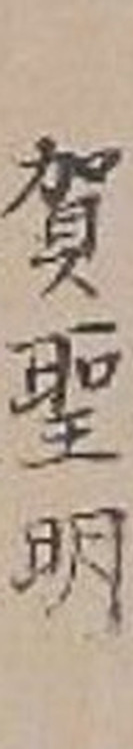賀聖明
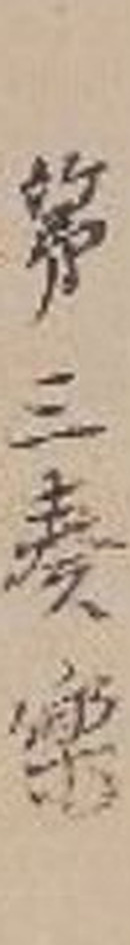第三奏楽
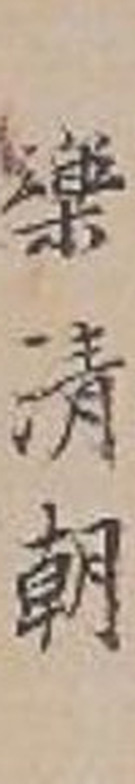楽清朝
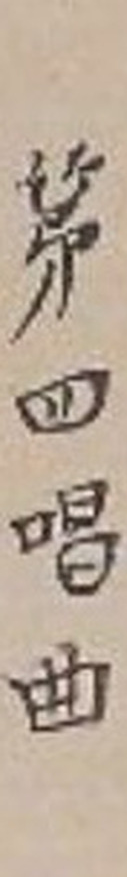第四唱曲
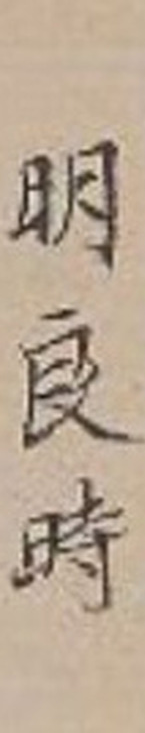明良時
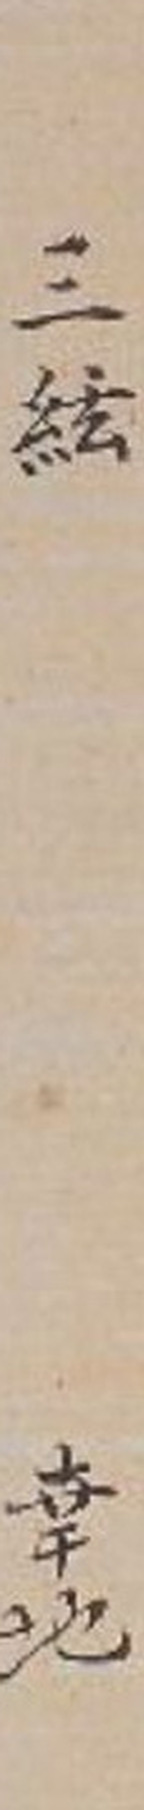三絃幸地
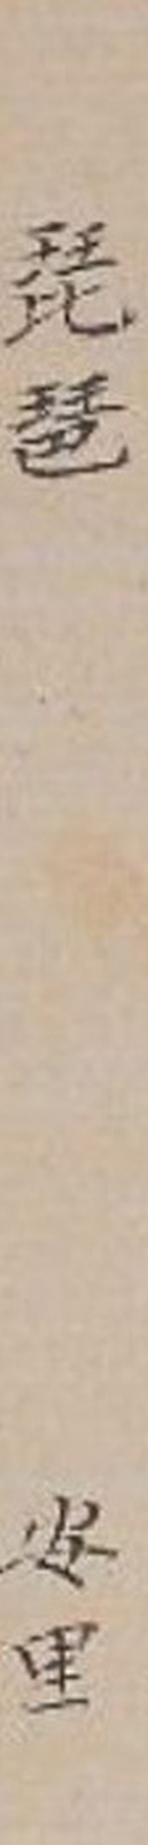琵琶安里
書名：琉球来聘志(仮) 天保十三年
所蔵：University of the Ryukyus Library
